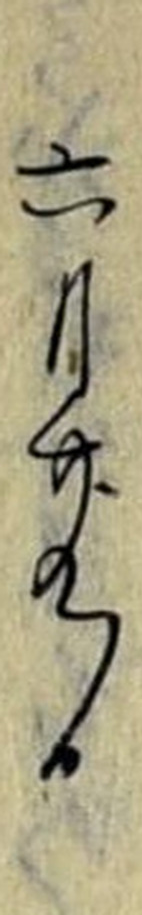六月廿九日
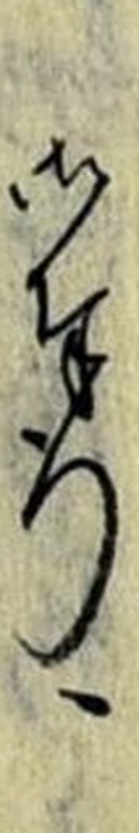御奉行へ
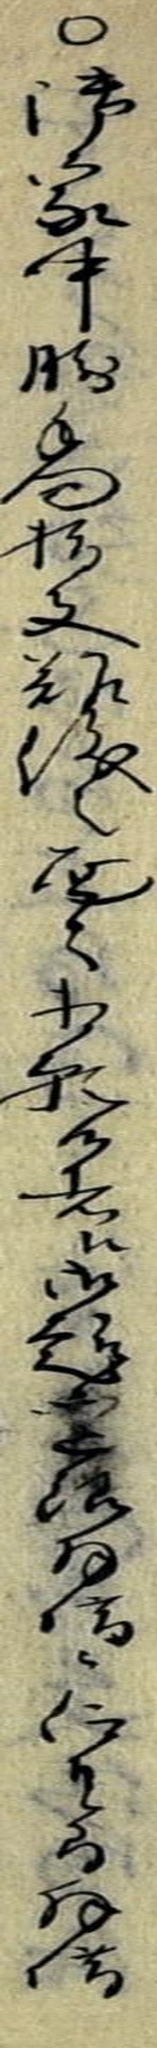○御家中勝手向指支難儀之面々相願候者江御趣意銀拝借被仰付候間拝借
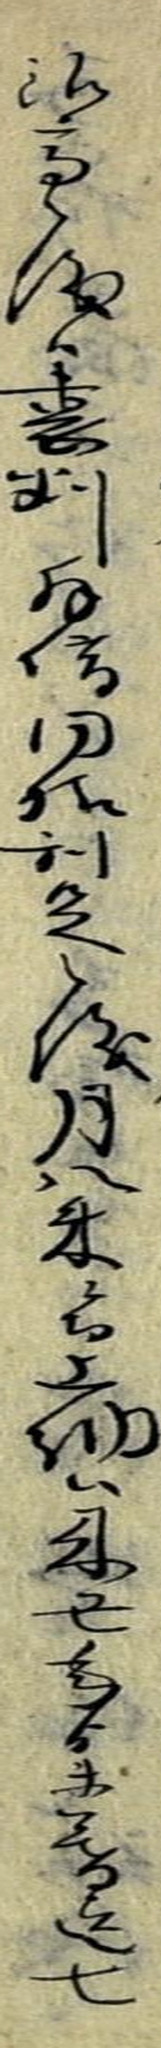銀高之儀裏判拝借同様利足之儀月八朱に而上納は来丑年ゟ未暮迄七
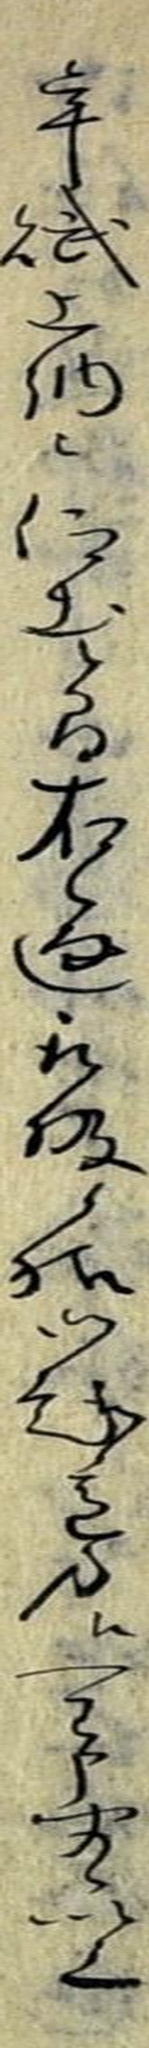年賦上納被仰出候間右之通取扱候様御趣意方江可被申聞候以上
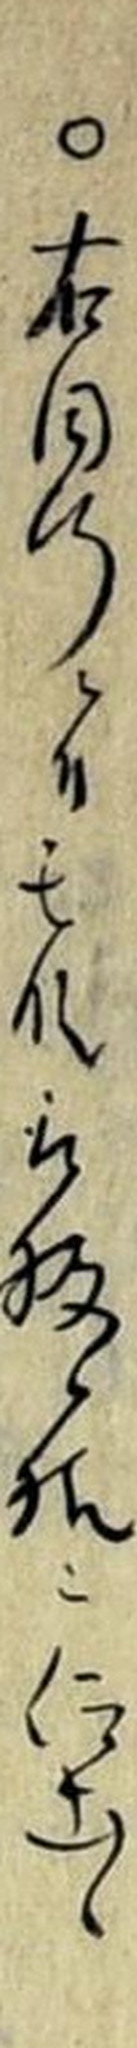○右同断に付其段取扱候様被仰出候
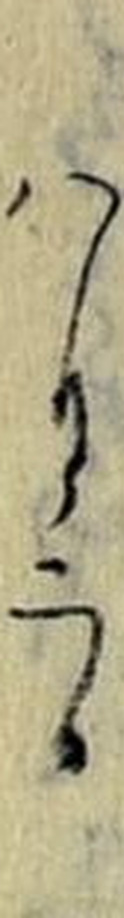八月二日
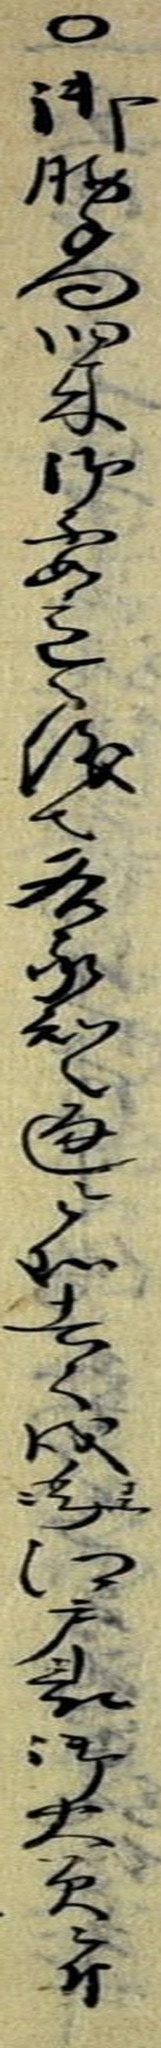○御勝手向旧來御不如意之儀は各承知之通に候処去々戌年江戸表大災に付
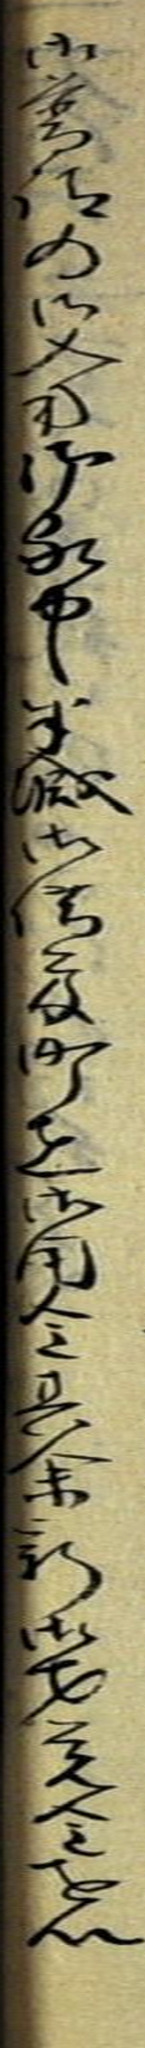御普請為御入用御家中半減御借米町在御用金其余新御才覚を以
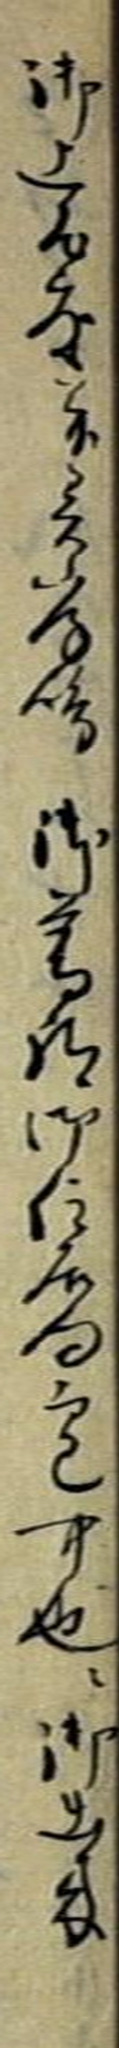御上屋敷并霊厳嶋御普請御住居向而己事也に御出来
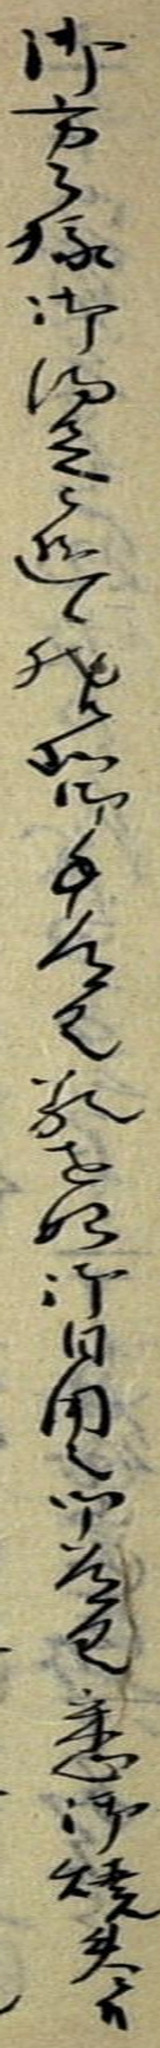御方々様御満足被遊候儀に候処御手道具類を始御日用之御道具悉御焼失に付
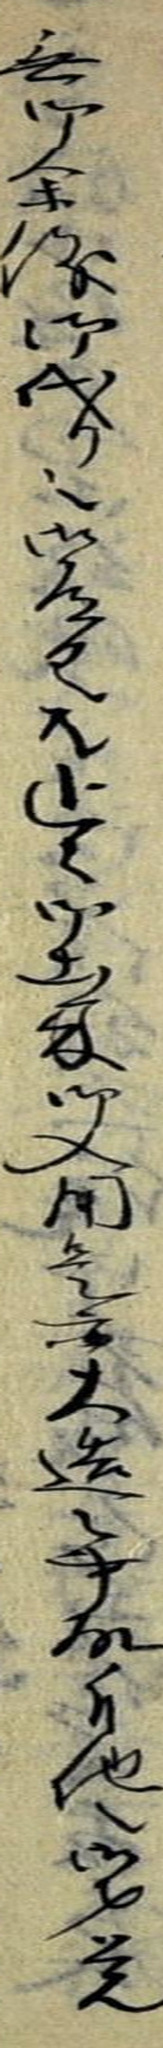無余儀御代り之御道具共追々御出来御入用是亦大造之事故自他之御才覚
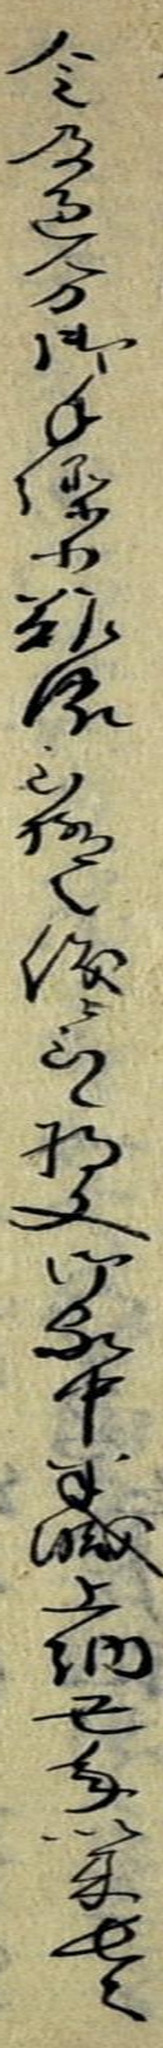金及過分御手繰相難澁至極之儀に至候猶又御家中半減上納丑年以来長々
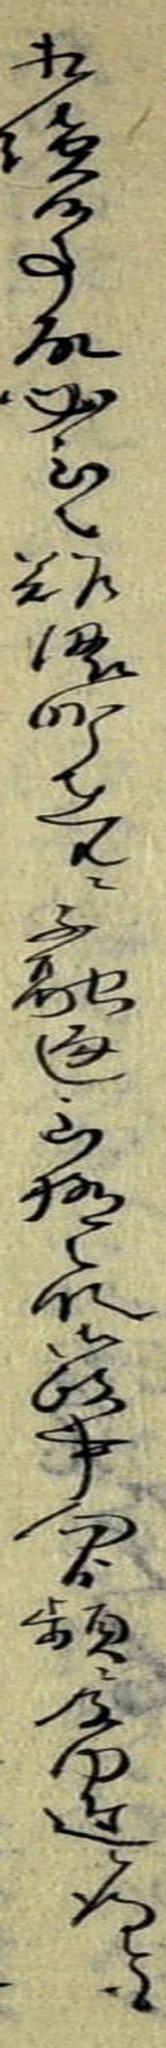相続候事故必至之難渋町在共に不融通至極之段御政事向ゟ頻に及内達候得とも
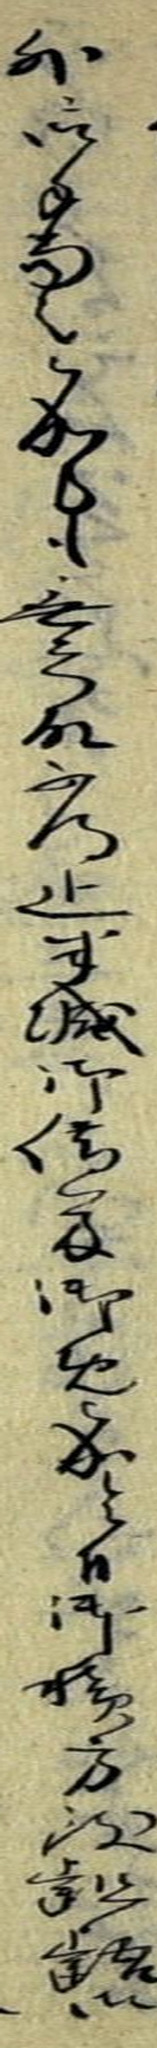外に御手当之被成方も無之故不得止半減御借米御免被成候に付御積方致齟齬御
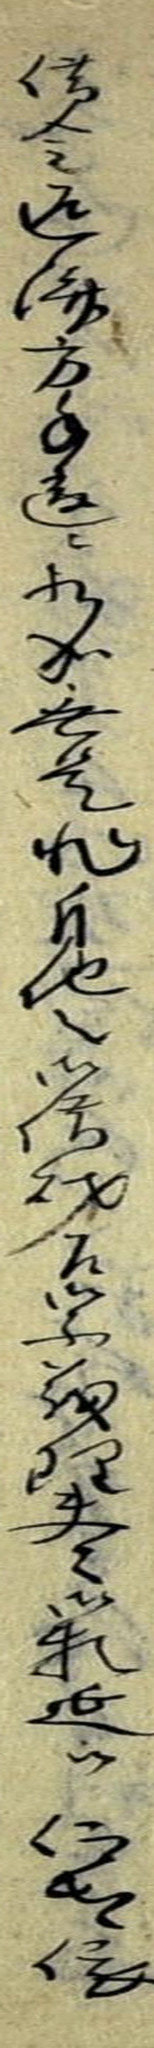借金返済方手違に相成無是非他へ御借財乍不義理夫々御頼延被仰出候依
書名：命令之部 四
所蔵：福井県文書館 Fukui Prefectural Archives
